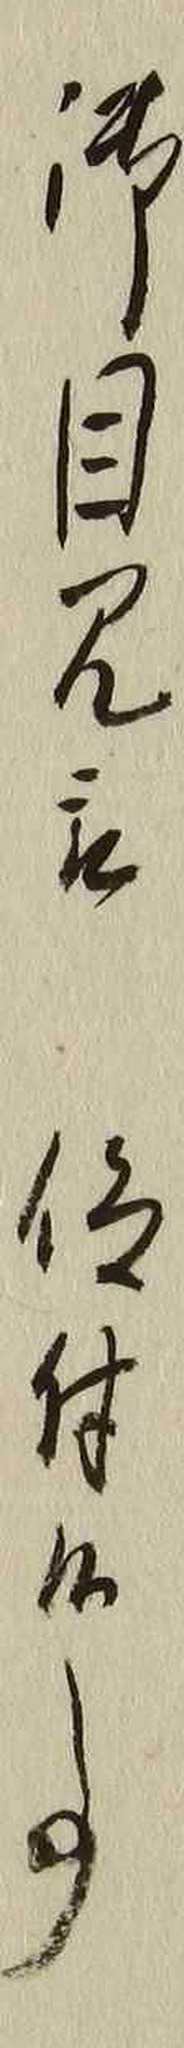御目見被仰付候事
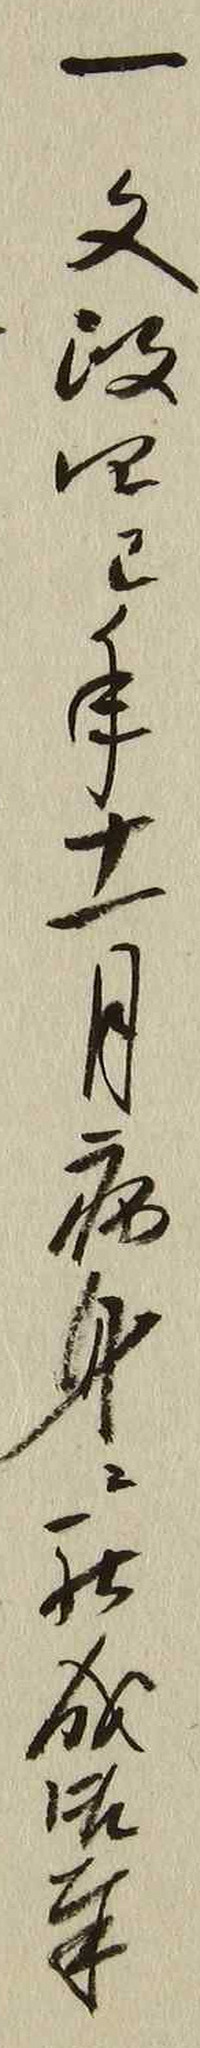一文政四巳年十一月病身ニ罷成御奉
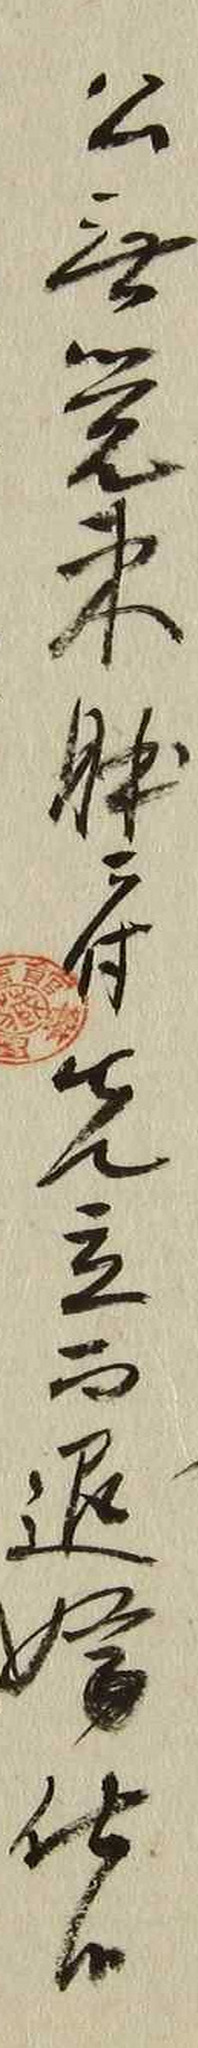公無覚束体ニ付先立而退嫡仕候
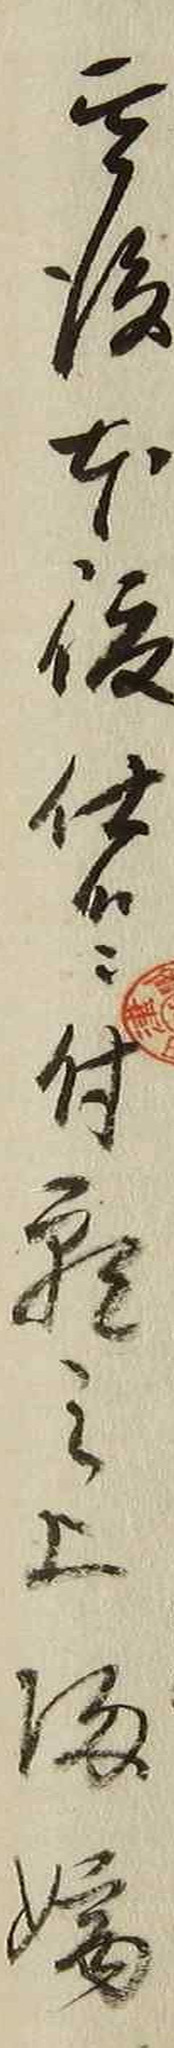其後本役仕候ニ付願之上帰嫡
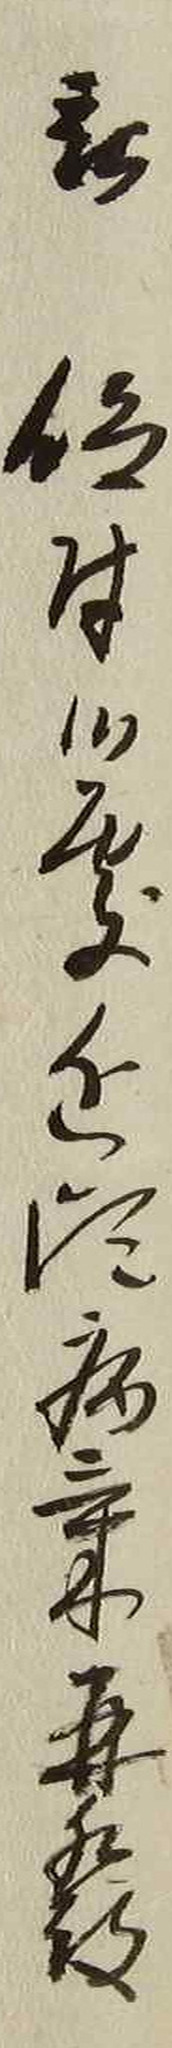被仰付候処近頃病気再発
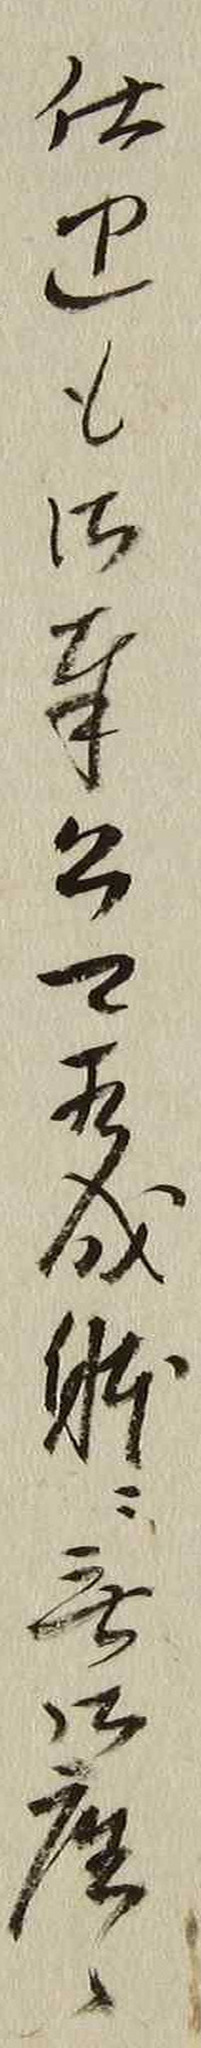仕迚も御奉公可相成体ニ無御座候
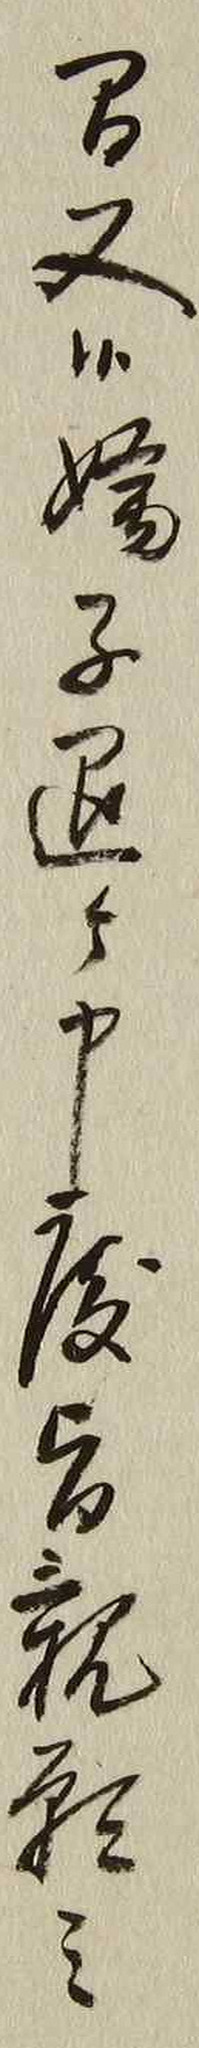間又候嫡子退ケ申度旨親願之
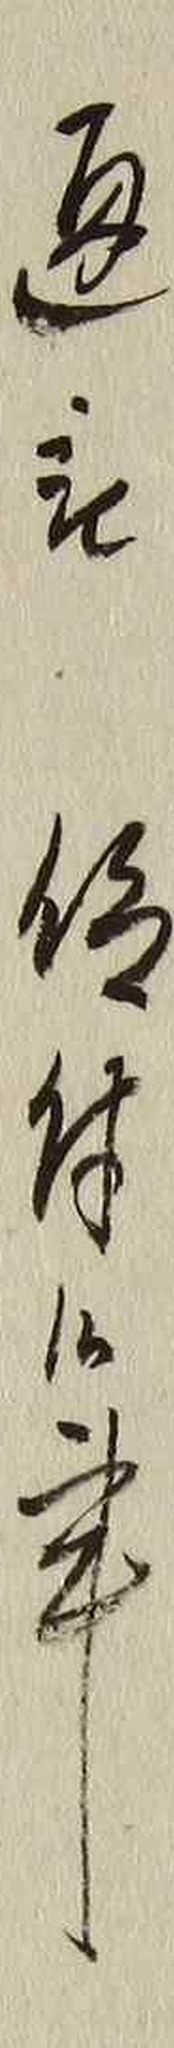通被仰付候事
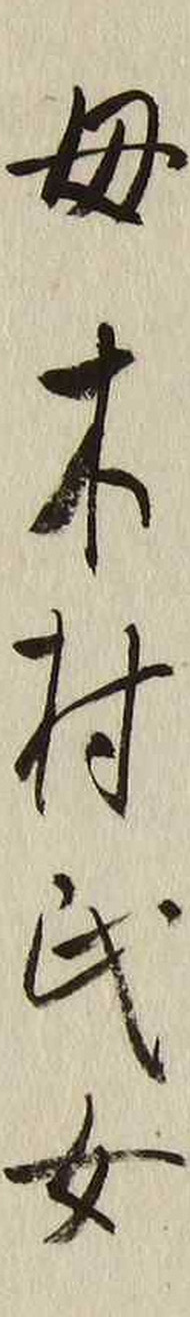母木村氏女
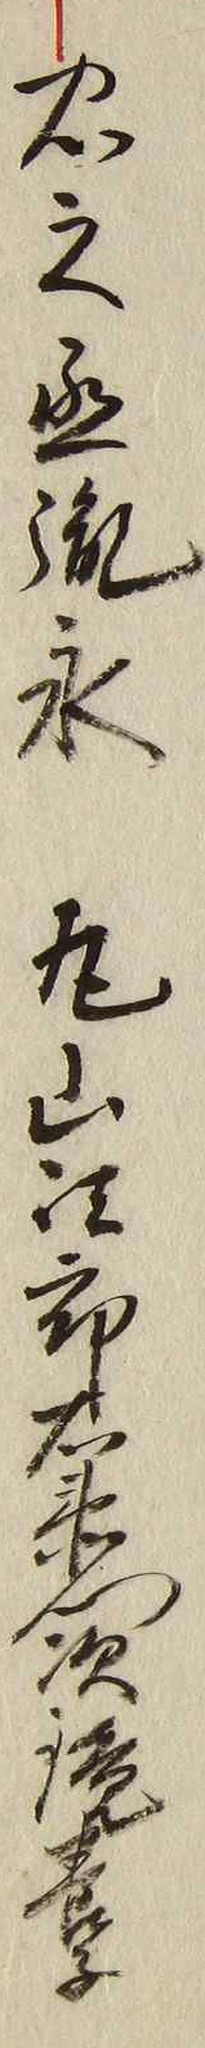忠之丞胤永丸山次郎右衛門次鏡養子

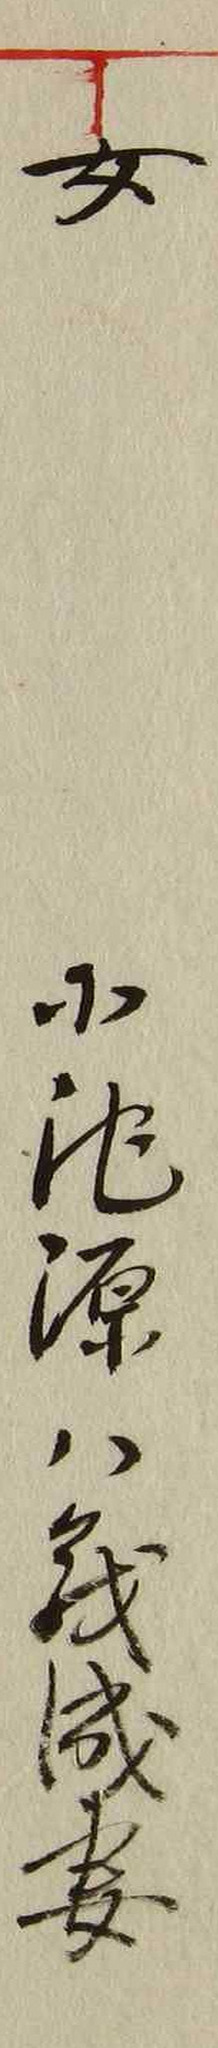女小池源八茂成妻
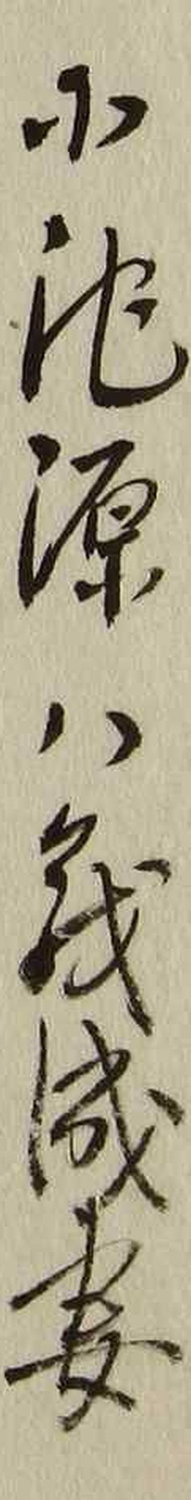女小池源八茂成妻
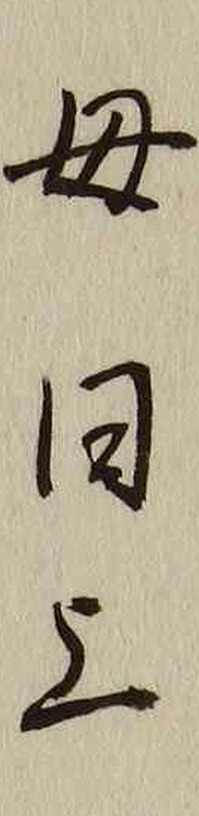母同上
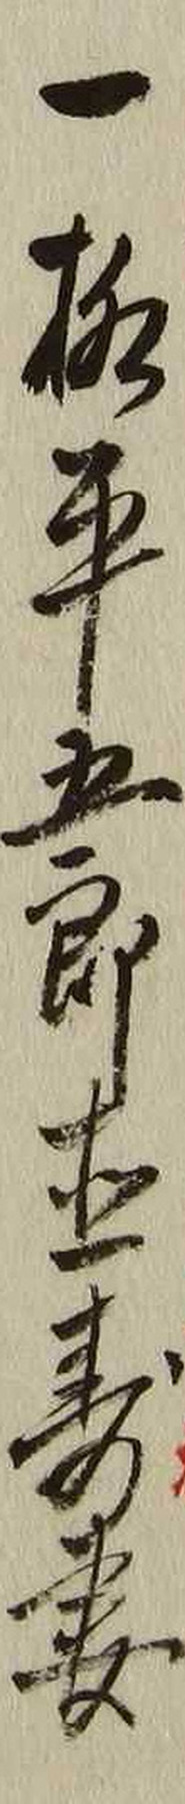女一柳平五郎直寿妻
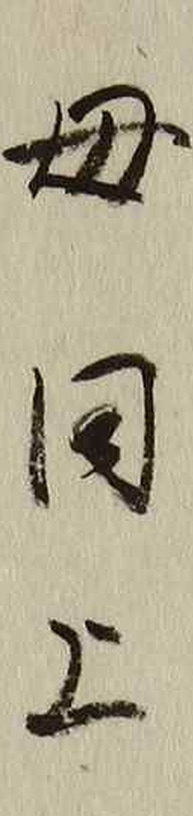母同上
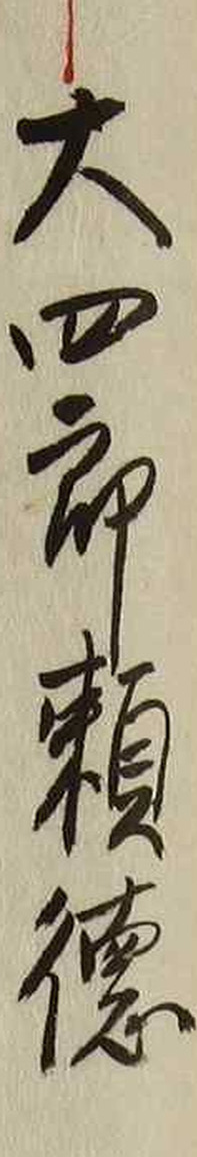大四郎頼徳
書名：諸士系譜　巻之351　す之部1
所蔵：会津若松市立会津図書館
